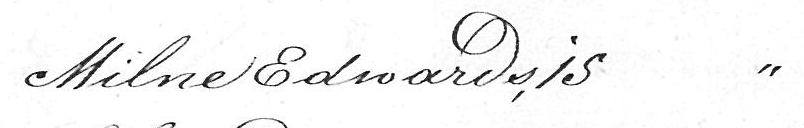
Milne Edwards 15 "
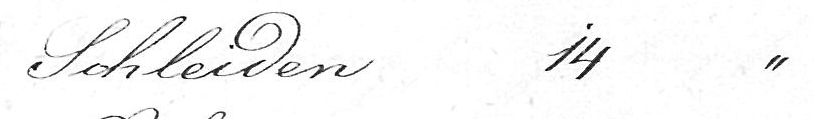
Schleiden 14 "
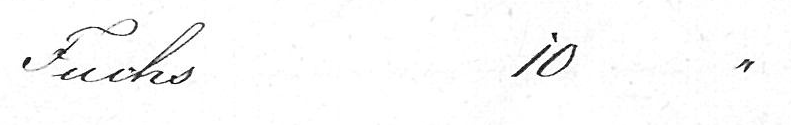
Fuchs 10 "
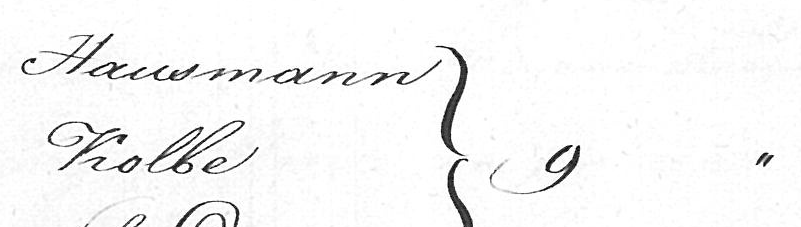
Hausmann 9 "
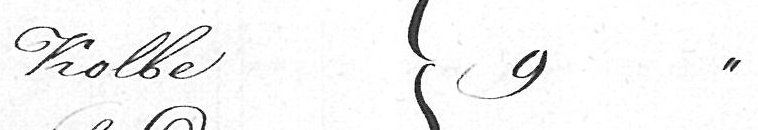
Kolbe 9 "
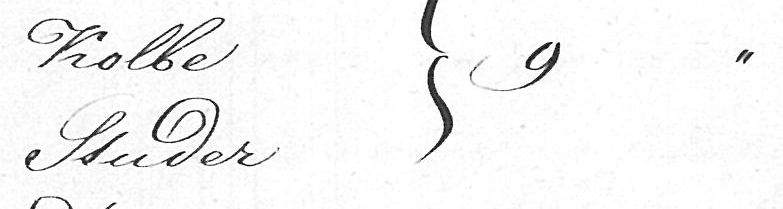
Studer 9 "
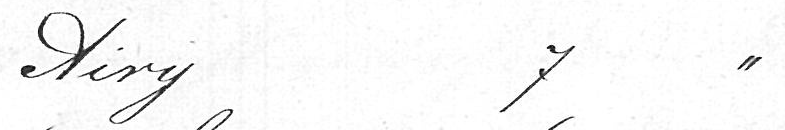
Airy 7 "
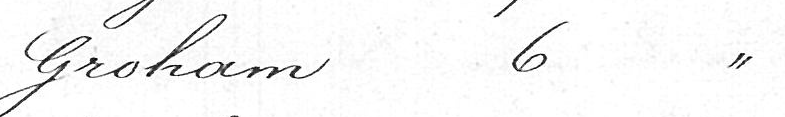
Groham 6 "
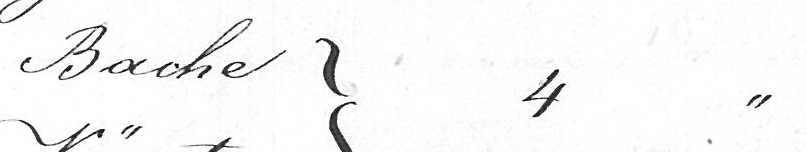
Bache 4 "
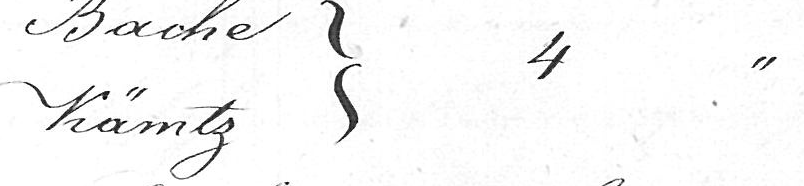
Kämtz 4 "
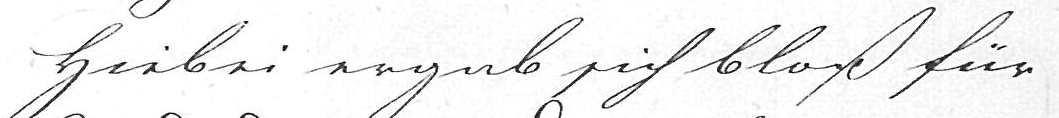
Hienbei ergab sich bloß für
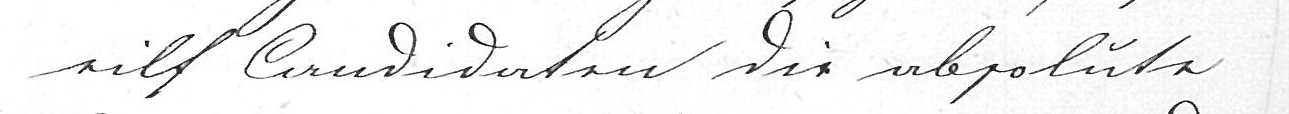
eilf Candidaten die absolute
